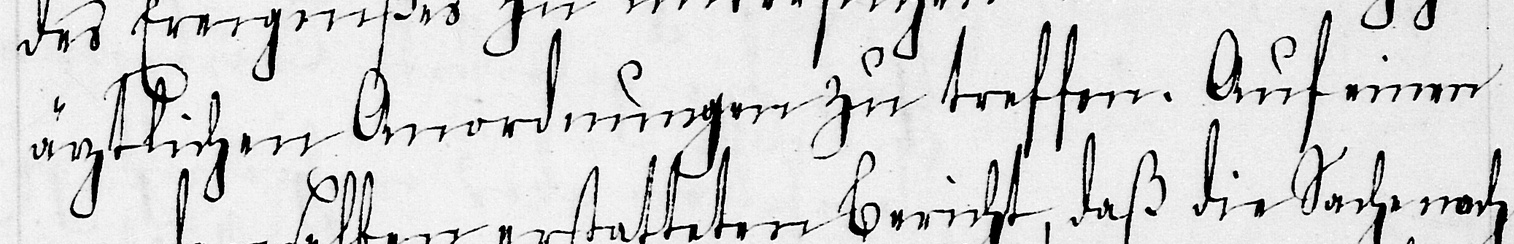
ärztlichen Anordnungen zu treffen. Auf einen
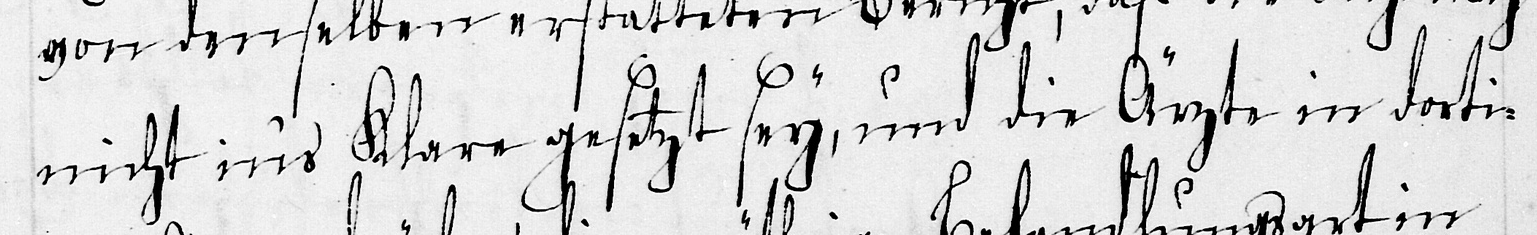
nicht in‘s Klare gesetzt sey, und die Ärzte in dorti¬
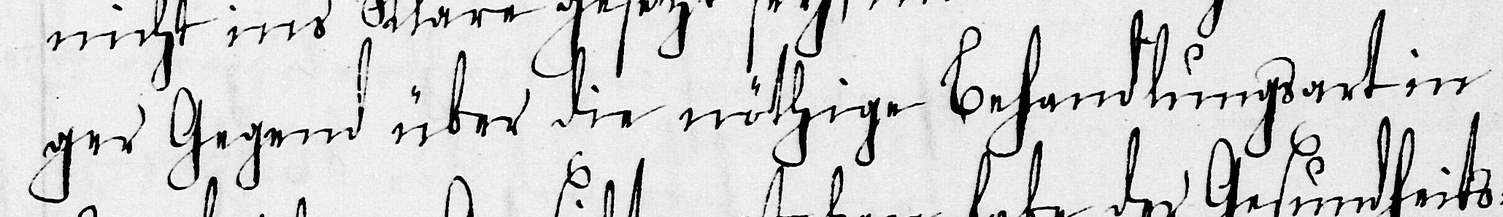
ger Gegend über die nöthige Behandlungsart in
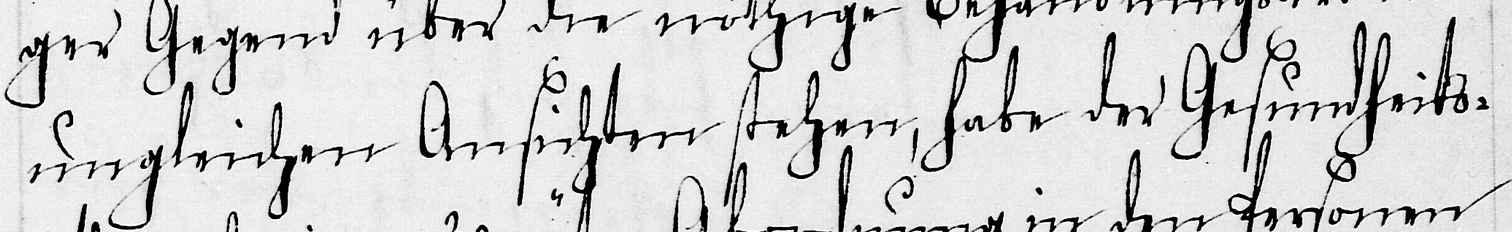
ungleichen Ansichten stehen, habe der Gesundheits¬
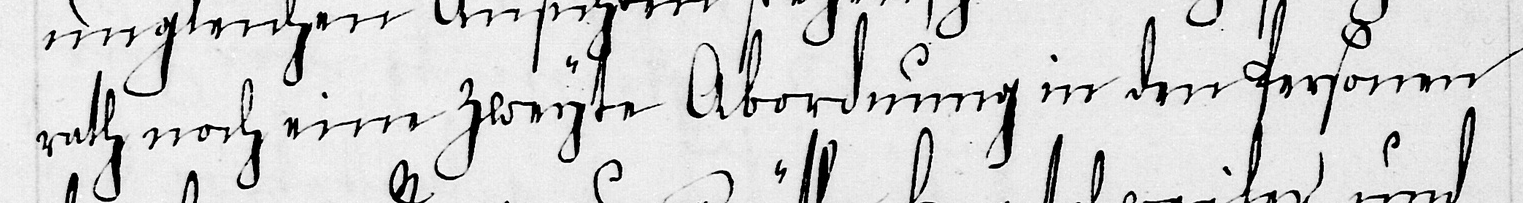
rath noch eine zweyte Abordnung in den Personen
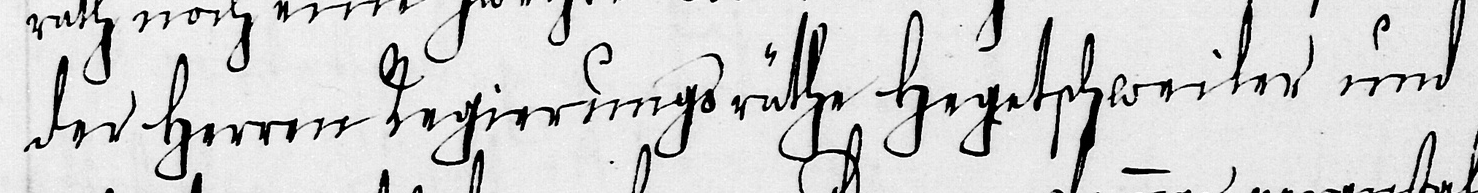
der Herren Regierungsräthe Hegetschweiler und
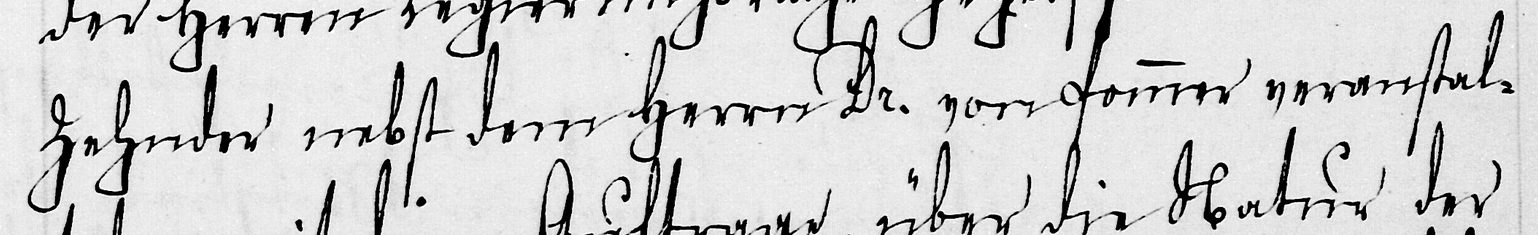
Zehnder nebst dem Herrn Dr. von Pommer veranstal¬
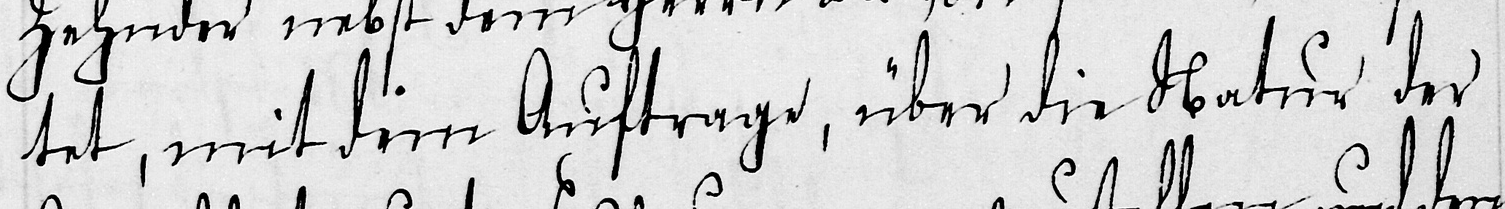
tet, mit dem Auftrage, über die Natur der
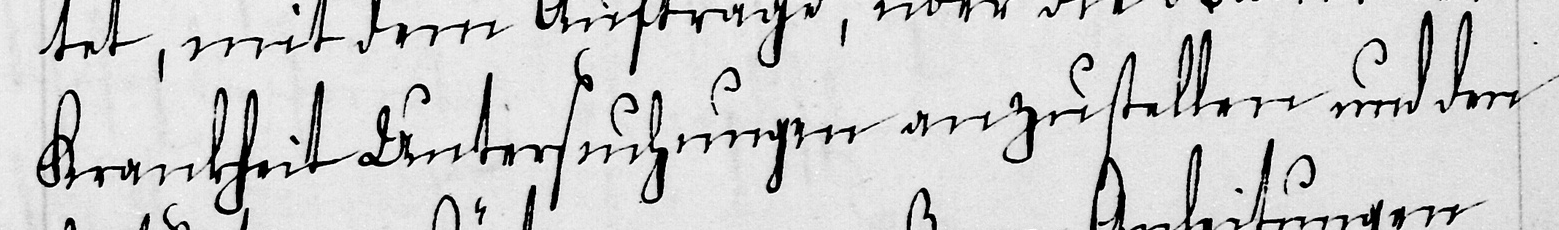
Krankheit Untersuchungen anzustellen und den
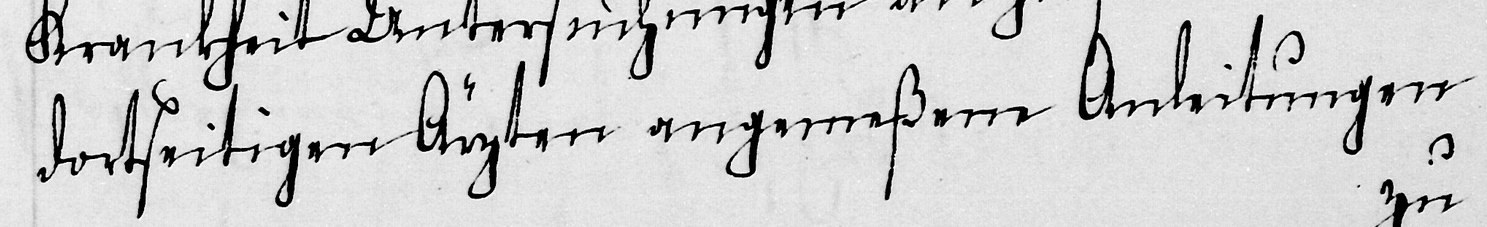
dortseitigen Ärzten angemeßene Anleitungen
